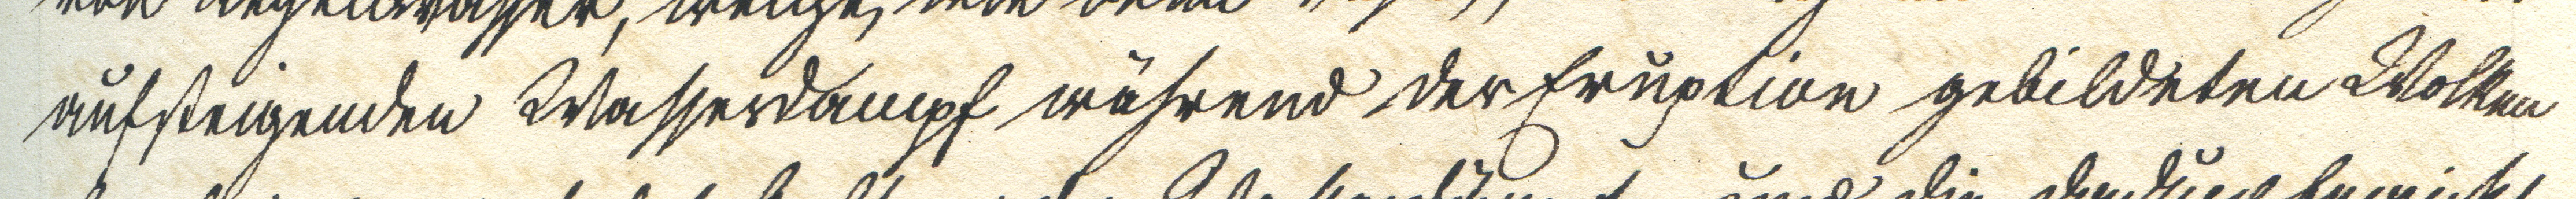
aufsteigenden Wasserdampf während der Eruption gebildeten Wolken
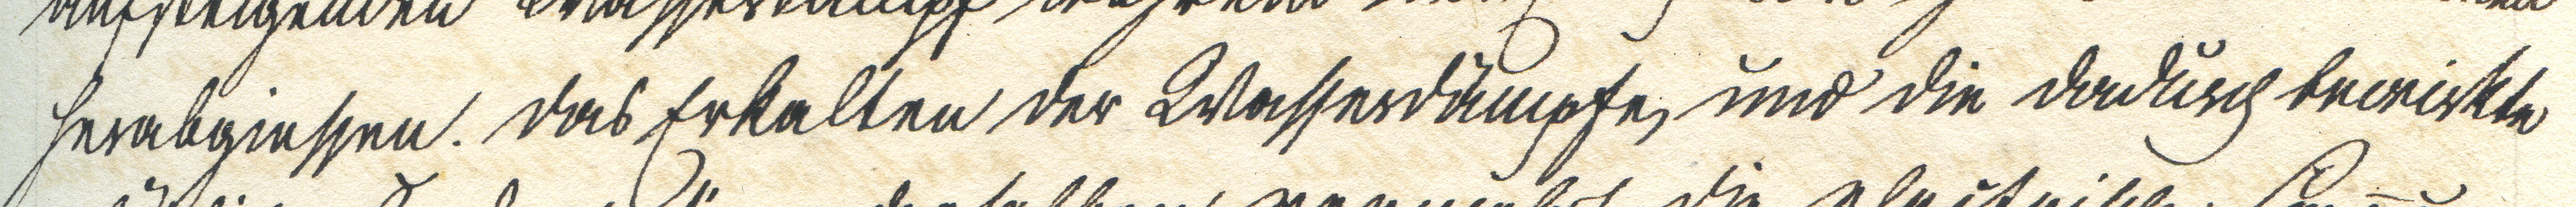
herabgiessen. Das Erkalten der Wasserdämpfe, und die dadurch bewirkte
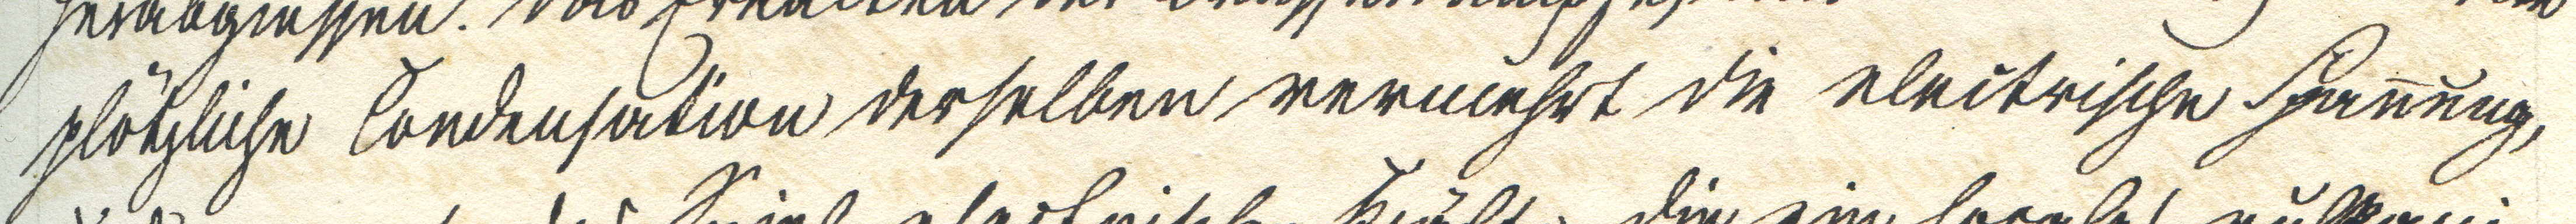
plötzliche Condensation derselben vermehrt die electrische Spañung,
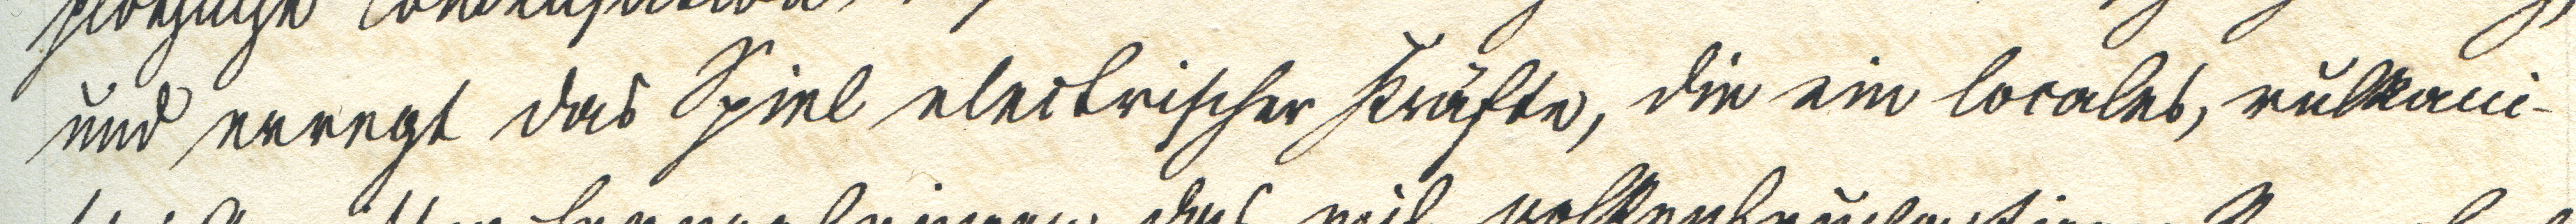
und erregt das Spiel electrischer Kräfte, die ein locales, vulkani-
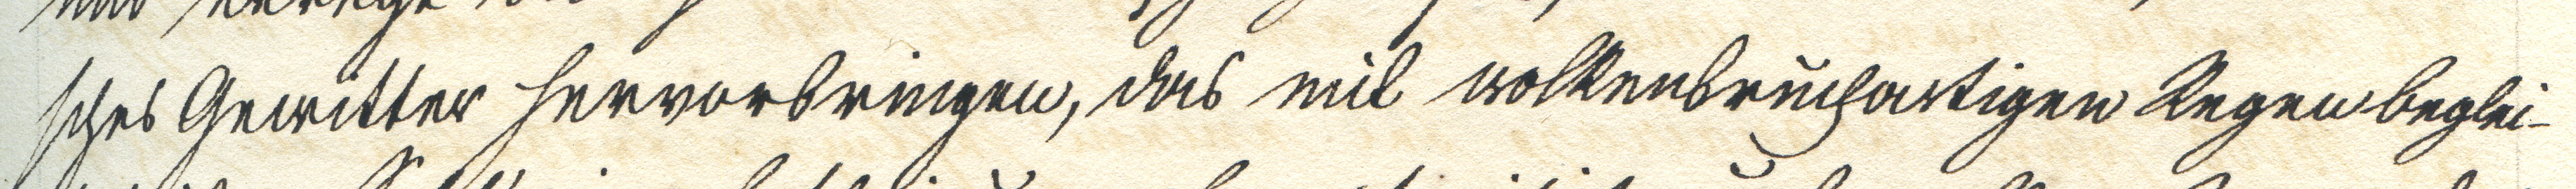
sches Gewitter hervorbringen, das mit einem wolkenbruchartigen Regen beglei-
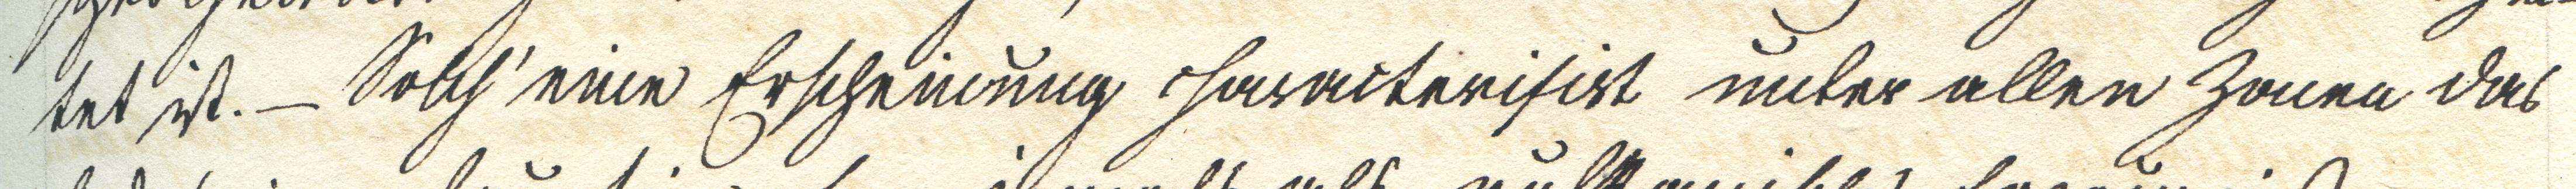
tet ist. – Solch’ eine Erscheinung characterisirt unter allen Zonen das
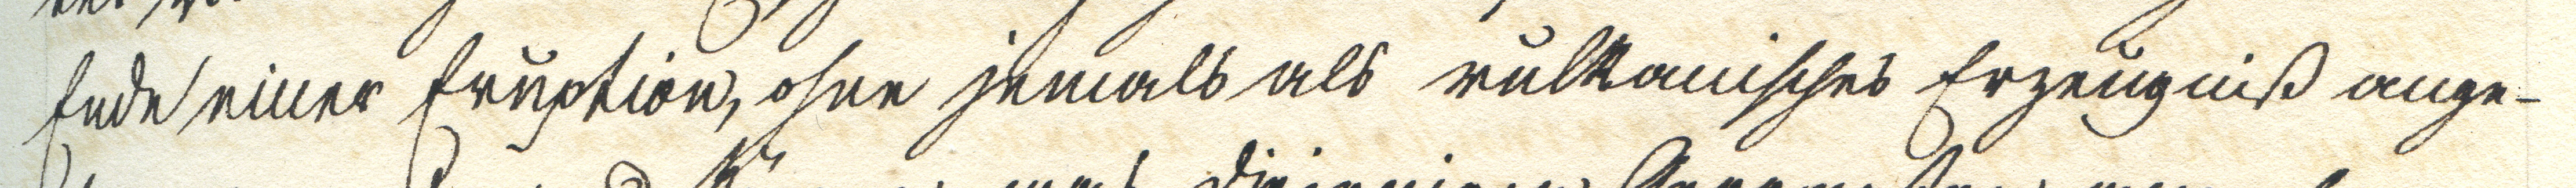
Ende einer Eruption, ohne jemals als vulkanisches Erzeugniß ange-
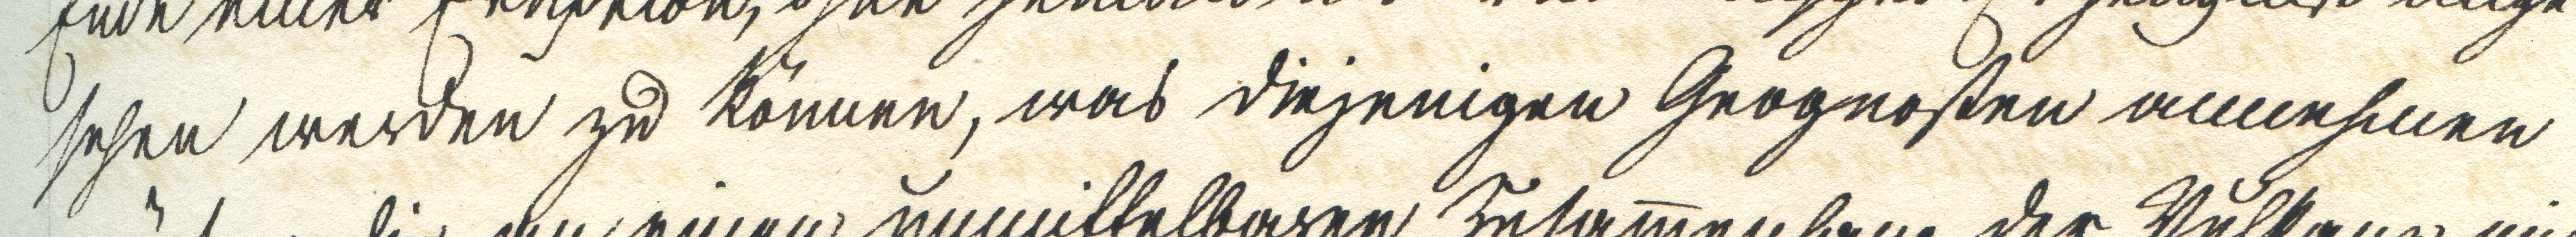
sehen werden zu können, was diejenigen Geognosten annehmen
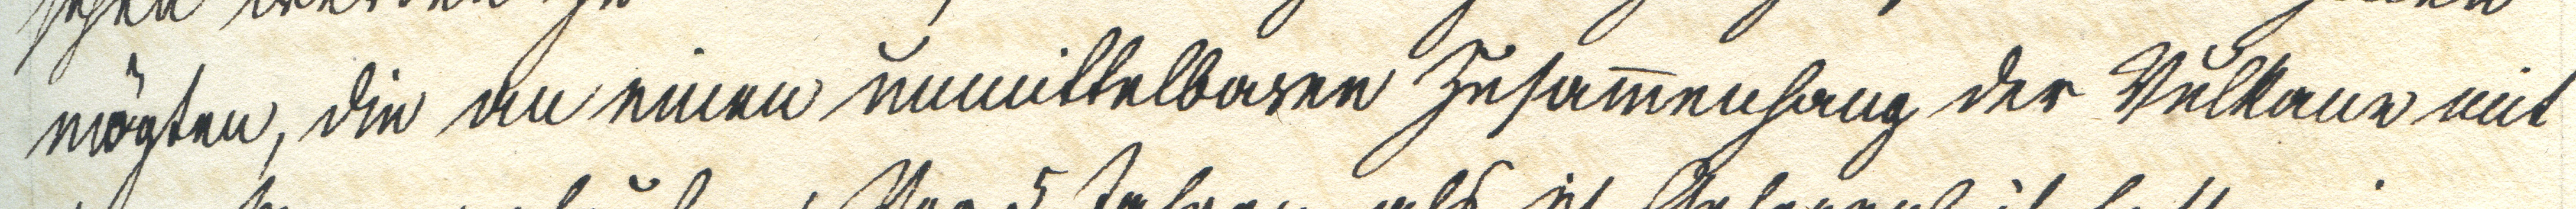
mögten, die an einen unmittelbaren Zusam̃enhang der Vulkane mit
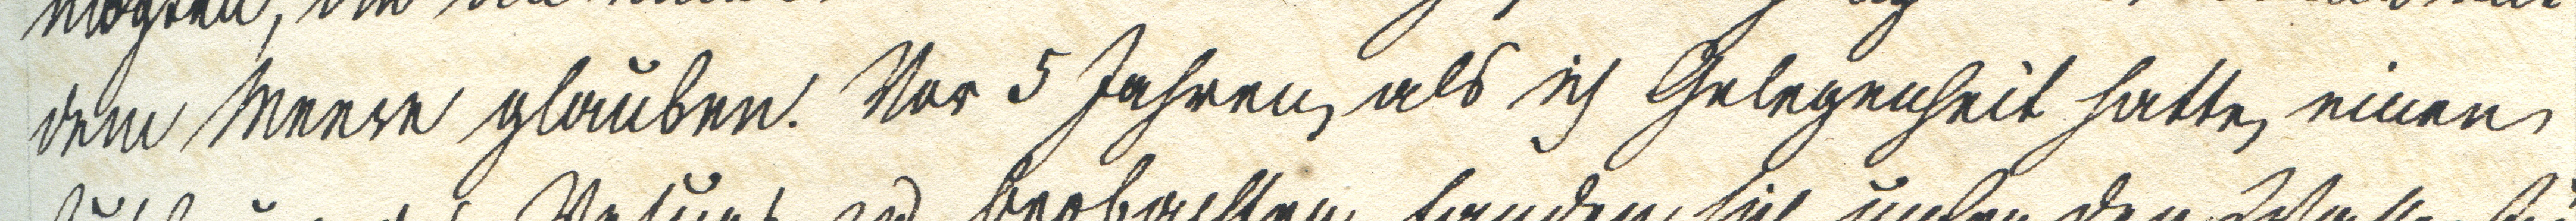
dem Meere glauben. Vor 5 Jahren, als ich Gelegenheit hatte, einen
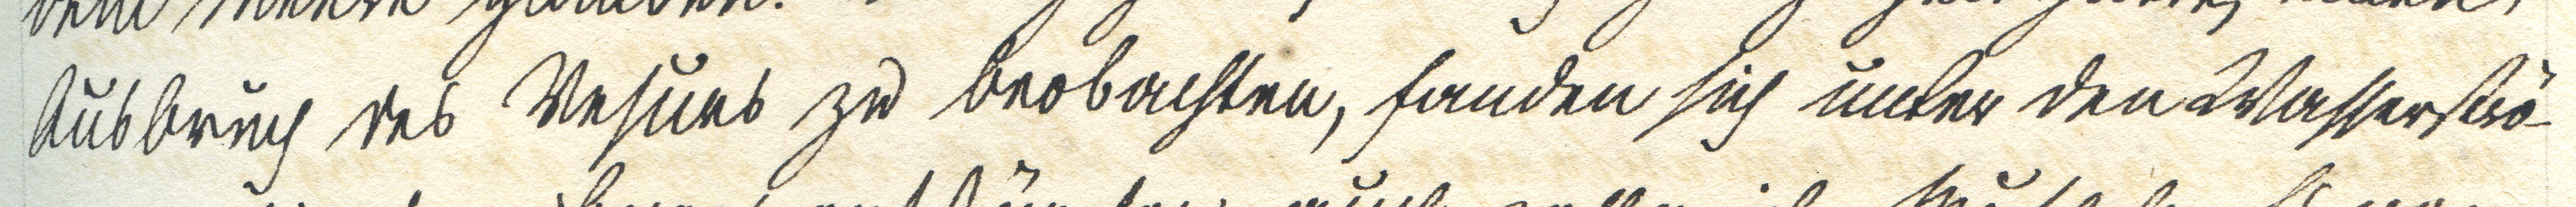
Ausbruch des Vesuvs zu beobachten, fanden sich unter den Wasserströ-
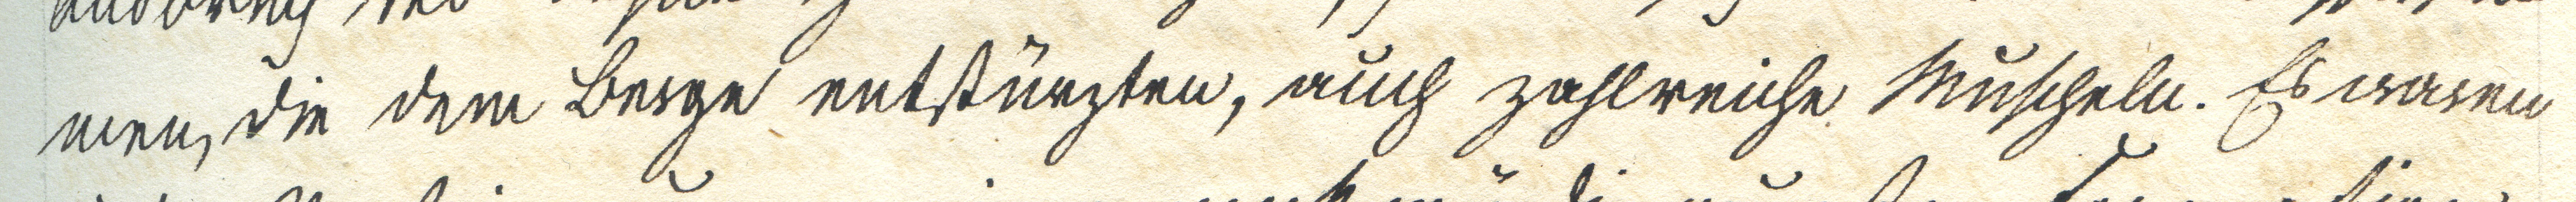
men, die dem Berge entstürzten, auch zahlreiche Muscheln. Es waren
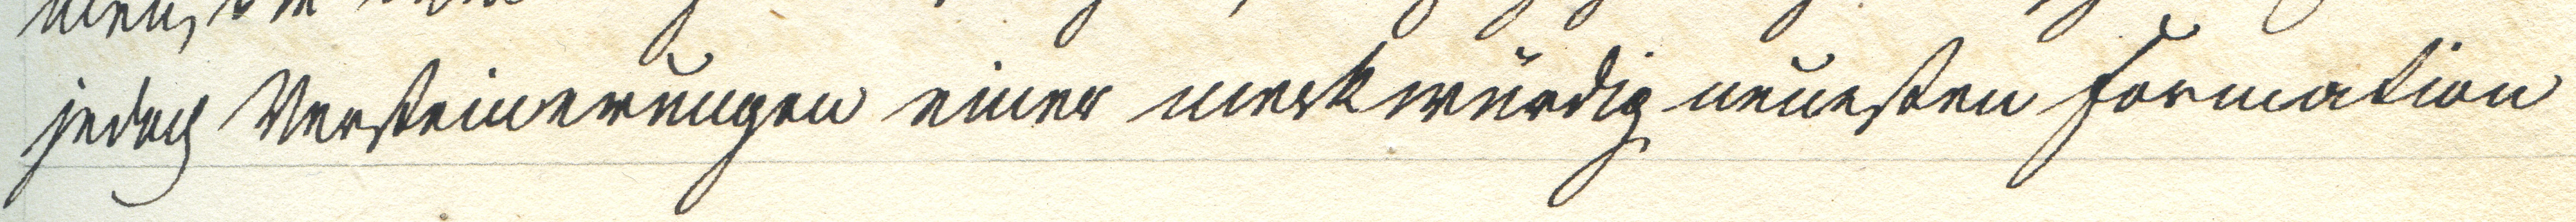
jedoch Versteinerungen einer merkwürdig neuesten Formation
